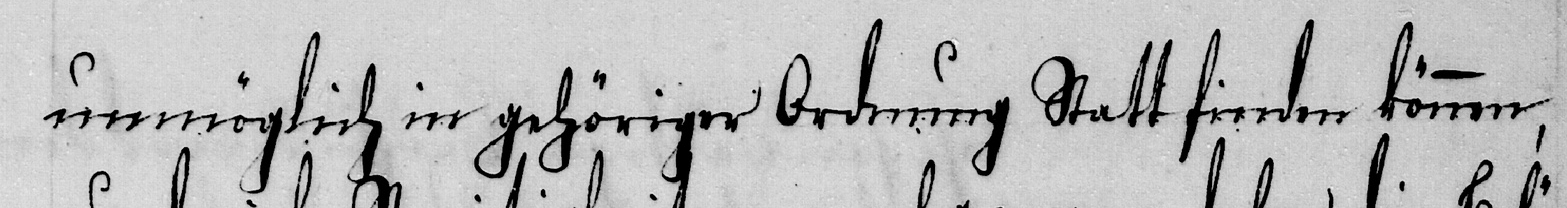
unmöglich in gehöriger Ordnung Statt finden können,
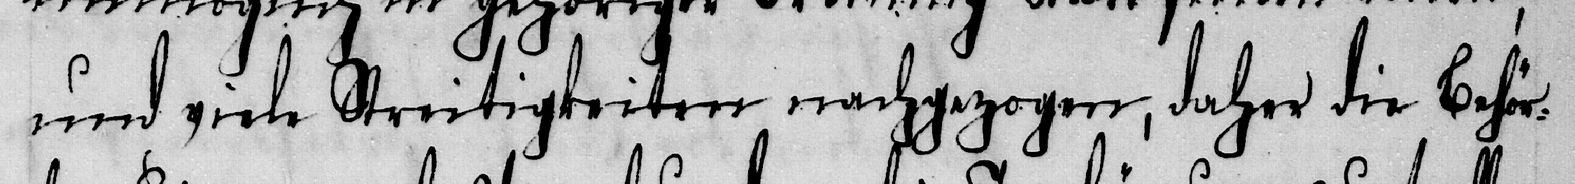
und viele Streitigkeiten nachgezogen, daher die Behör¬
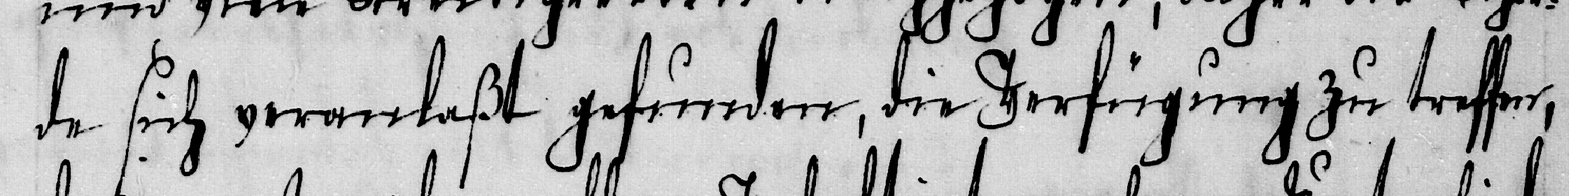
de sich veranlaßt gefunden, die Verfügung zu treffe¬
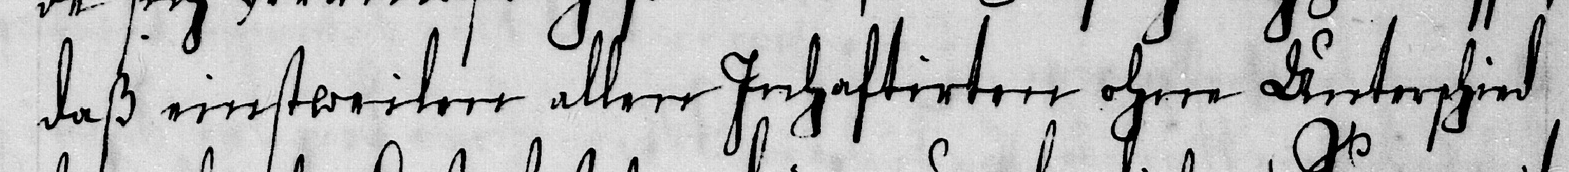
daß einstweilen allen Inhaftierten ohne Unterschied
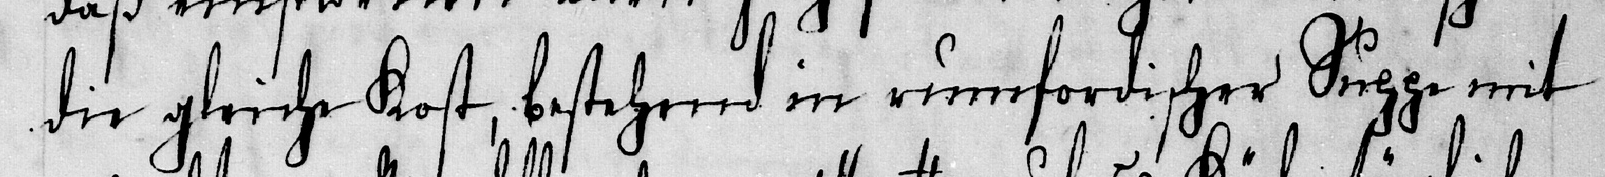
die gleiche Kost, bestehend in rumfordischer Suppe mit
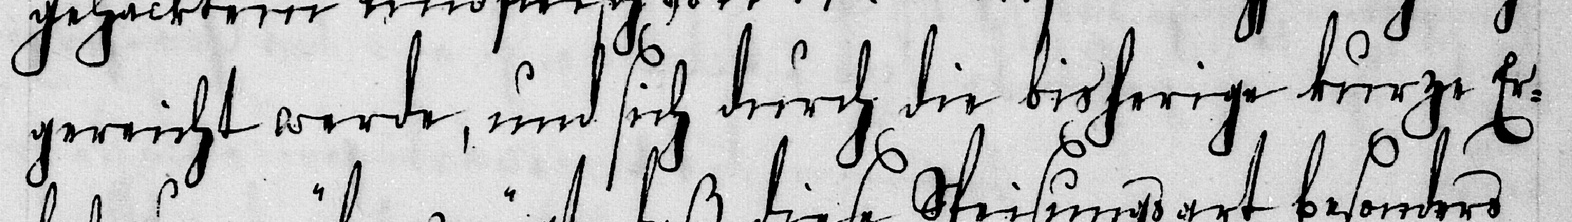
gereicht werde, und sich durch die bisherige kurze Er¬
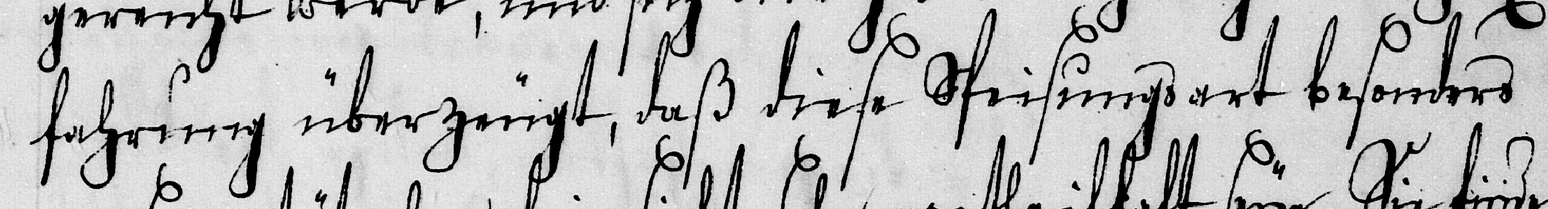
fahrung überzeugt, daß diese Speisungsart besonders
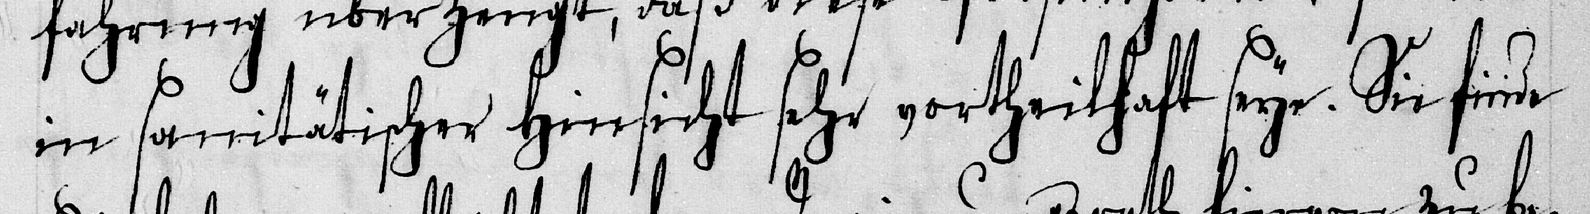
in sanitätischer Hinsicht sehr vorteilhaft seye. Sie finde
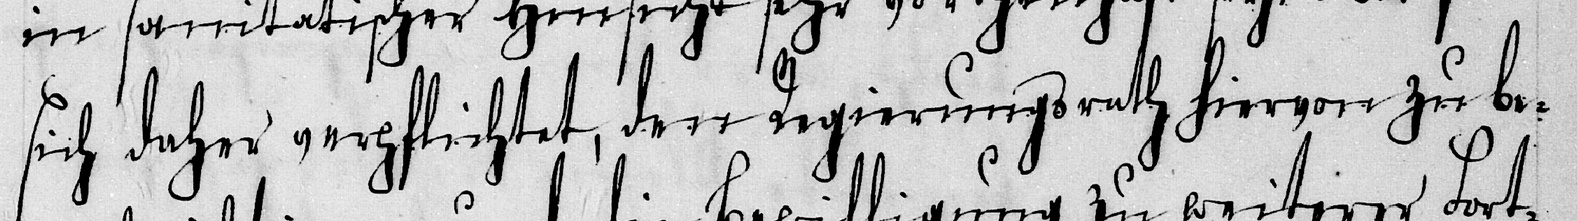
sich daher verpflichtet, den Regierungsrath hiervon zu be¬
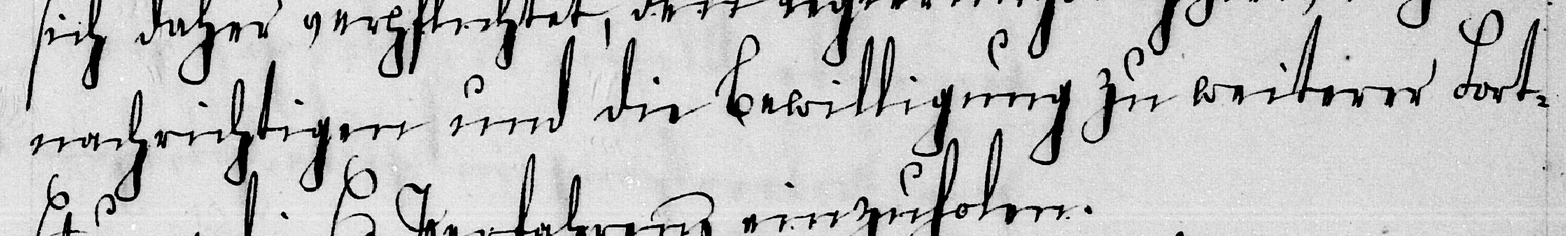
nachrichtigen und die Bewilligung zu weiterer Fort¬
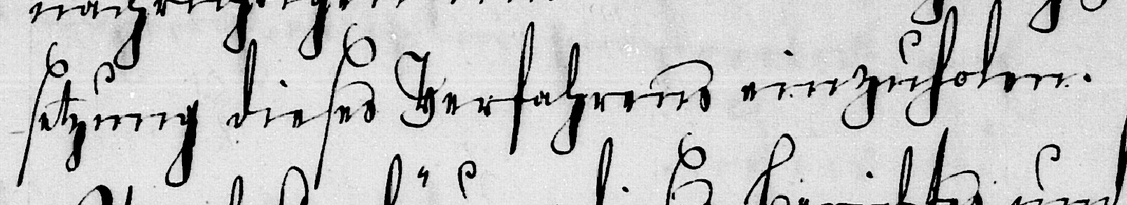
setzung dieses Verfahrens einzuholen.
